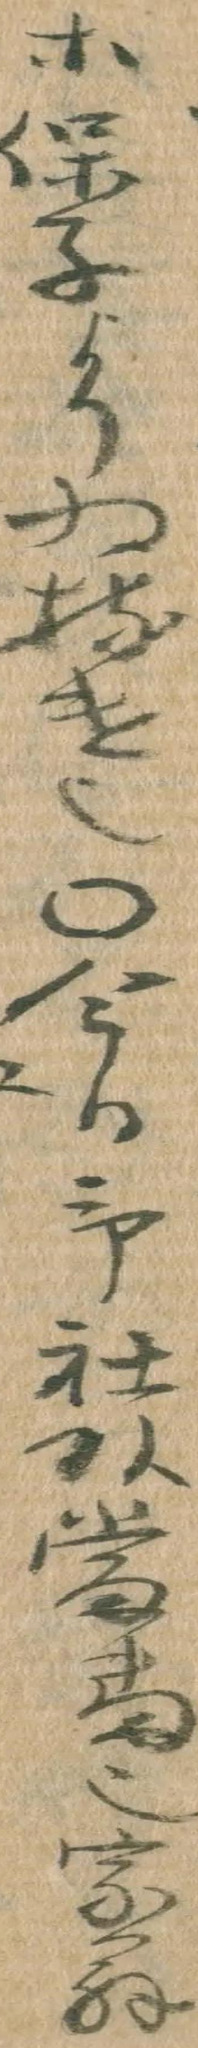等、保子より為持遣也、○今日神社頭當番也、家翁
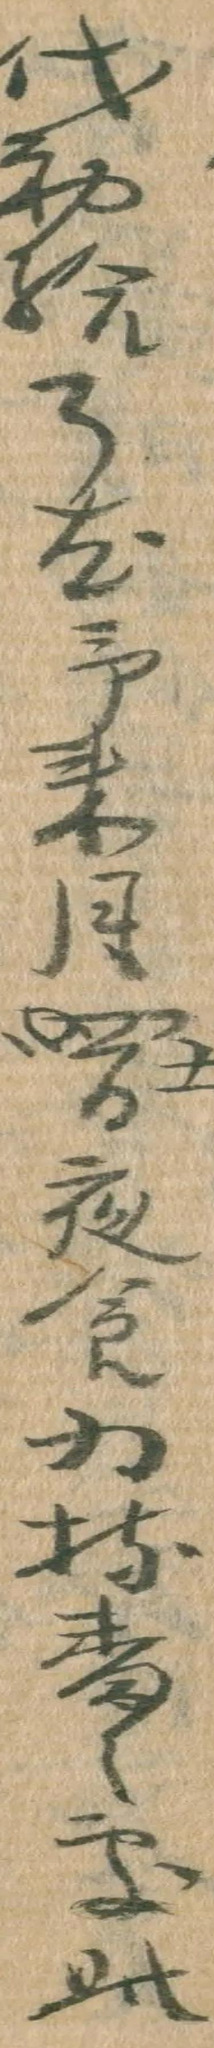代勤給了、尤予来月四五日夜食為持番之處、此
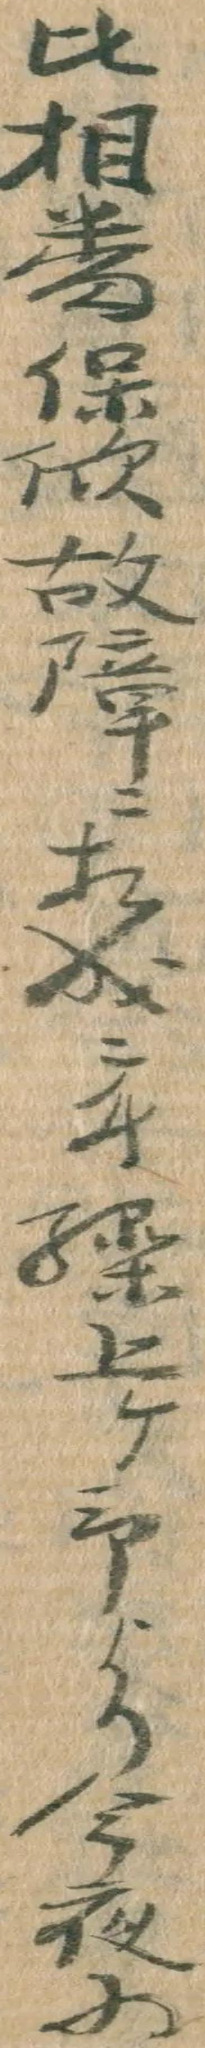比相番保欽故障ニ相成ニ付繰上ゲ、予より今夜為
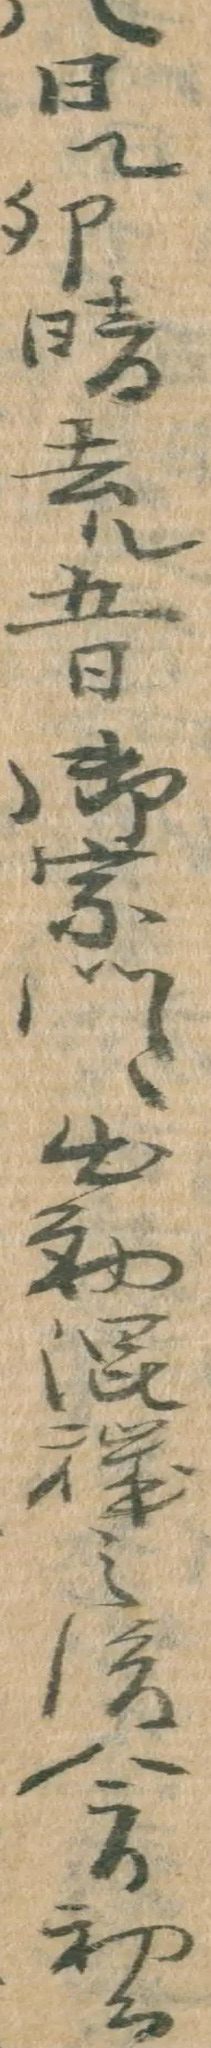八日乙申晴、去ル五日御家門へ出勤、混穢之後今日初而
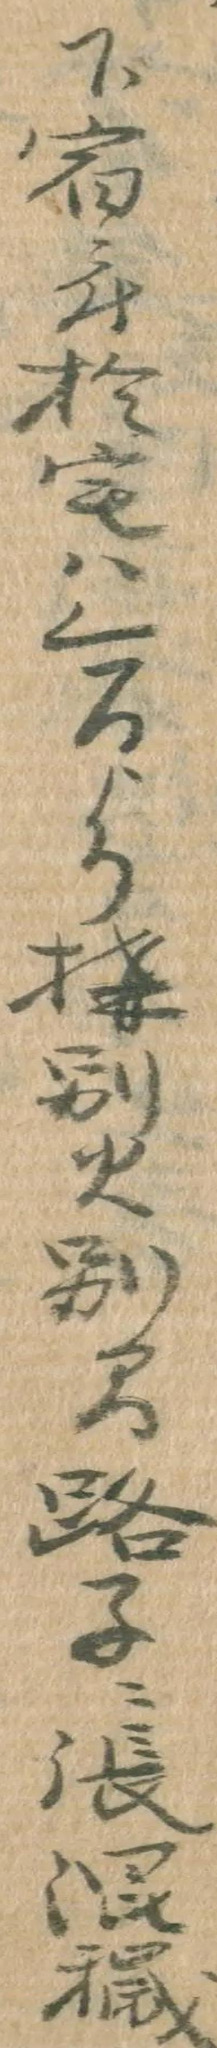下宿ニ付、於宅ハ今日より構別火別間路子ニ張、混穢

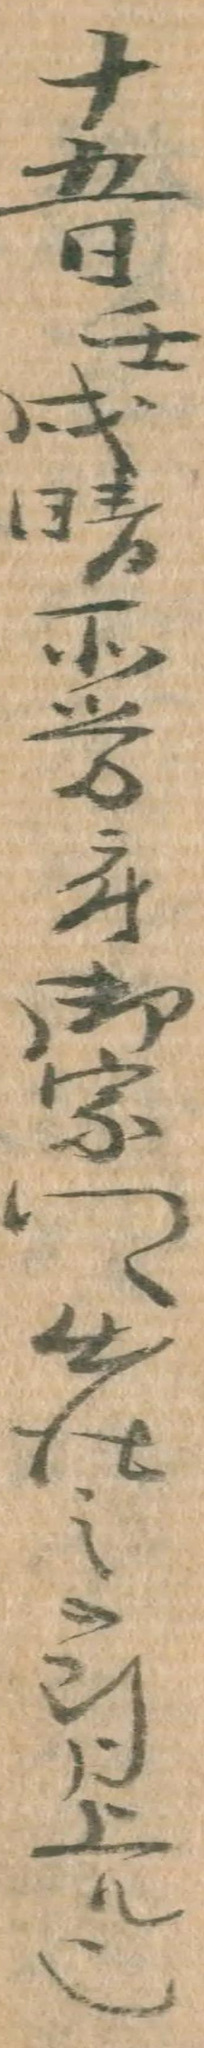十五日壬戌晴、所労ニ付御家門へ出仕之御断申上ル也、
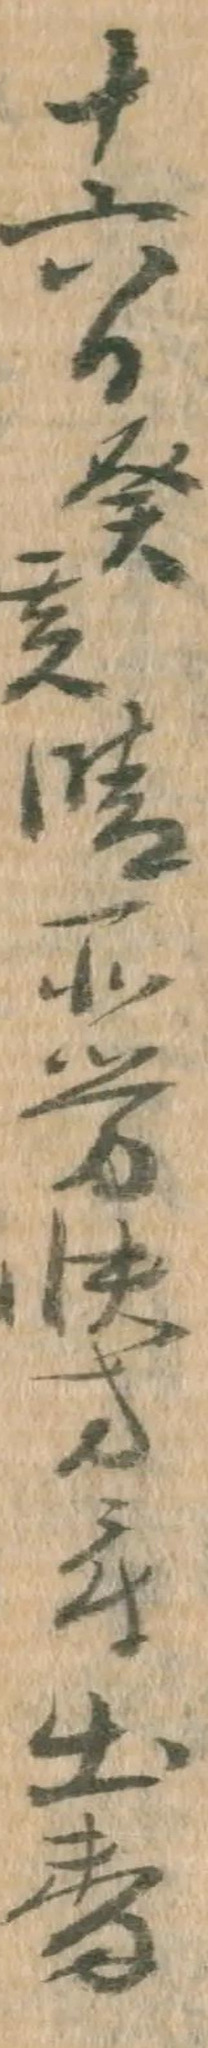十六日癸亥晴、所労快方ニ付出番、
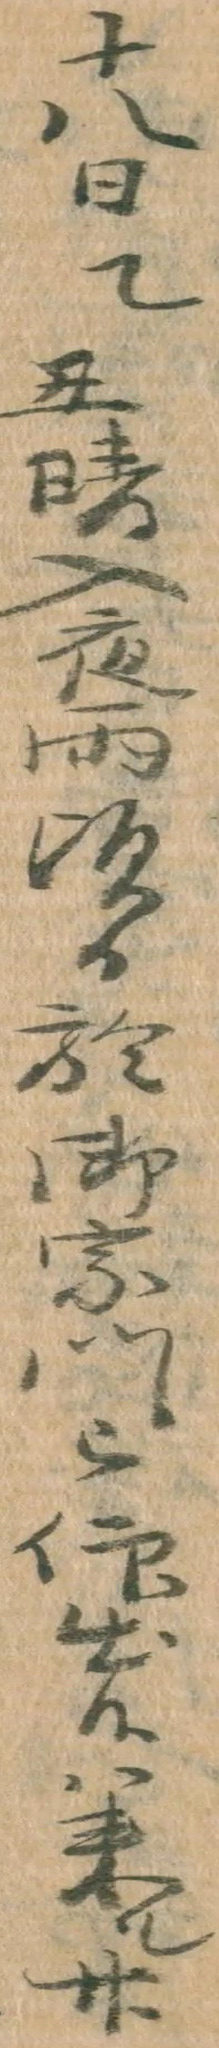十八日乙丑晴、入夜雨、昨日於御家門被仰出候ハ、来ル廿
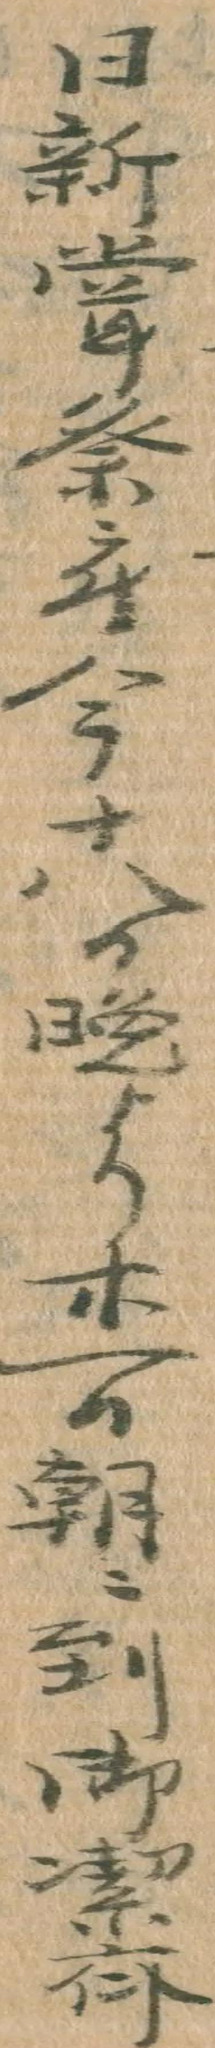日新嘗祭ニ付、今十八日晩より廿一日朝に到御潔
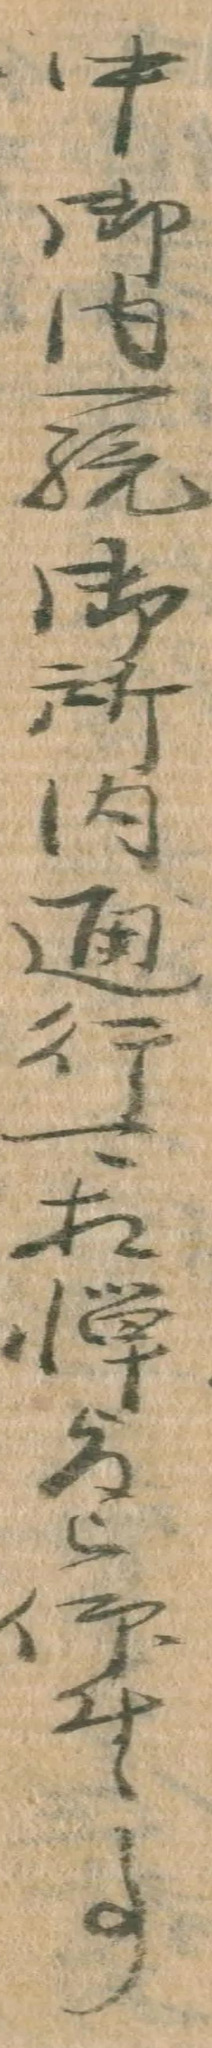中、御内一統御所内通行可相憚旨被仰付候事、
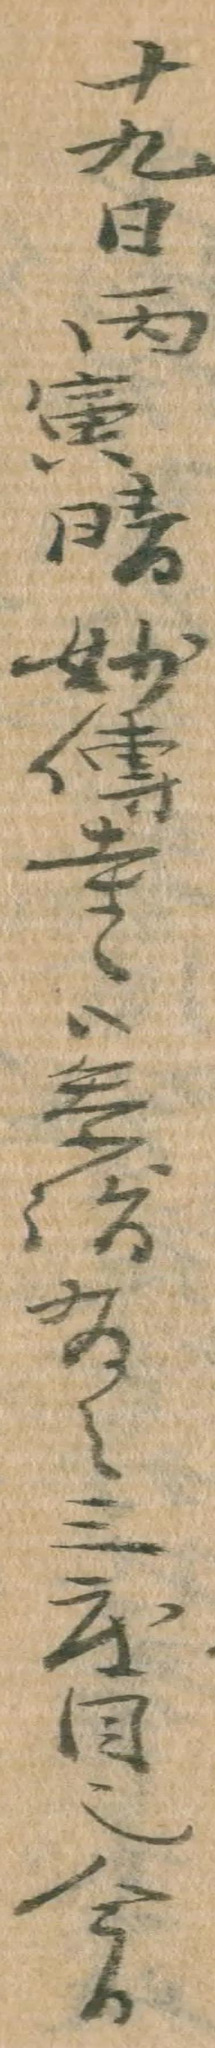十九日丙寅晴、妙傳寺へ御参詣有之、三度目也、今日
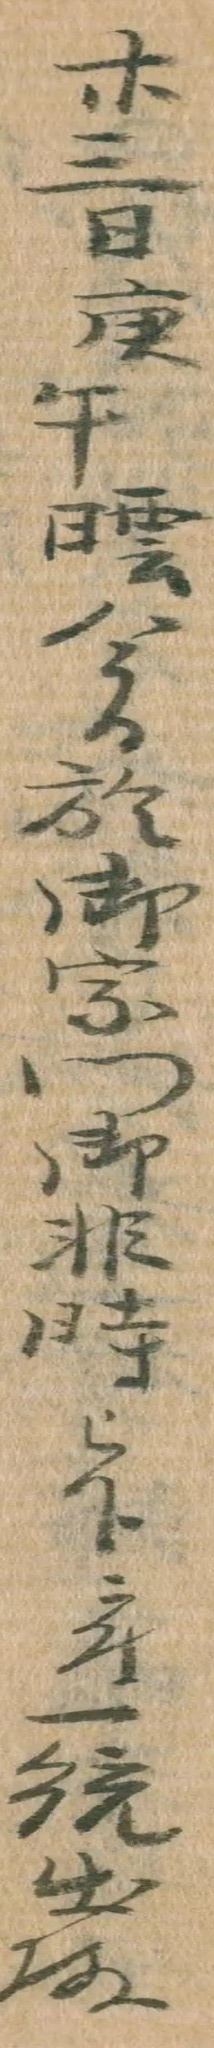廿三日庚午曇、今日於御家門御非時被下ニ付、一統出殿
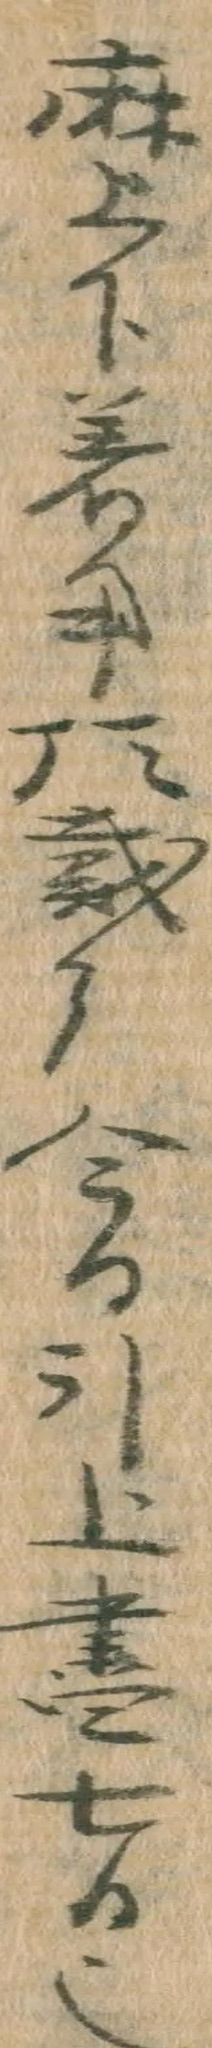麻上下着用頂戴了、今日引上書七日也、
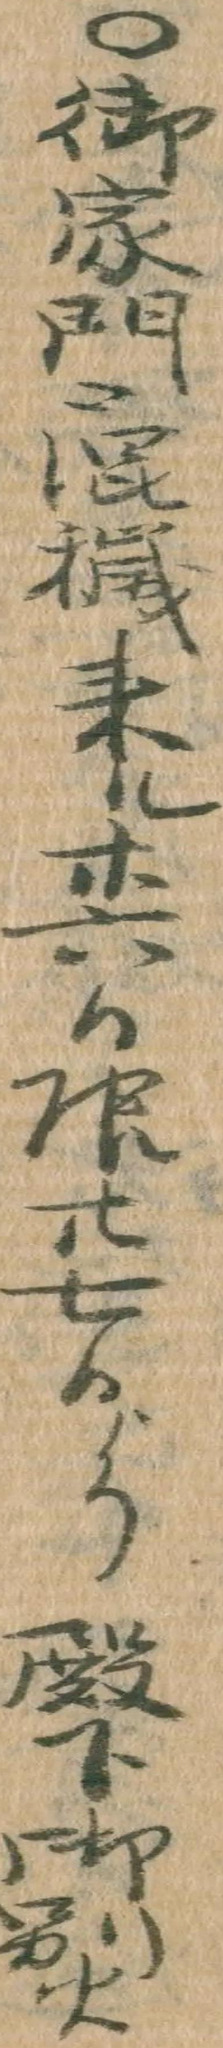○御家門御混穢、来ル廿六日限、廿七日より殿下御別火、
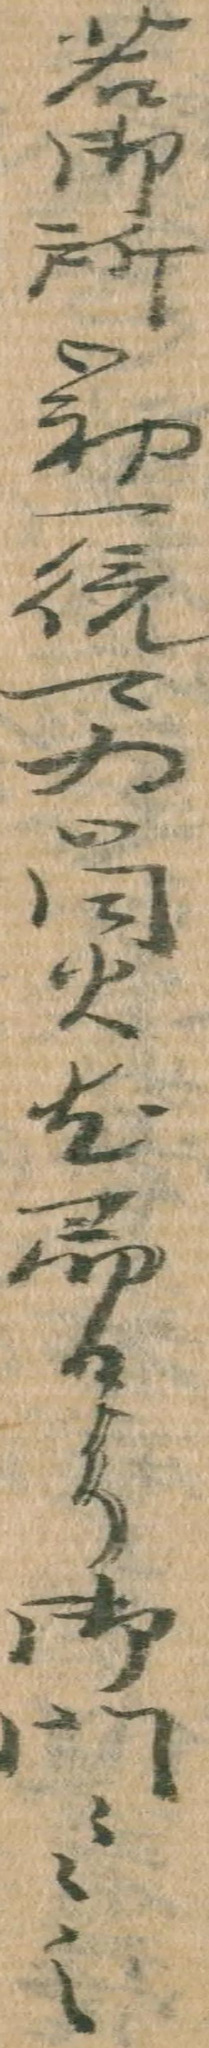若御所御初一統可為御同火、尤即日より御門〻也、
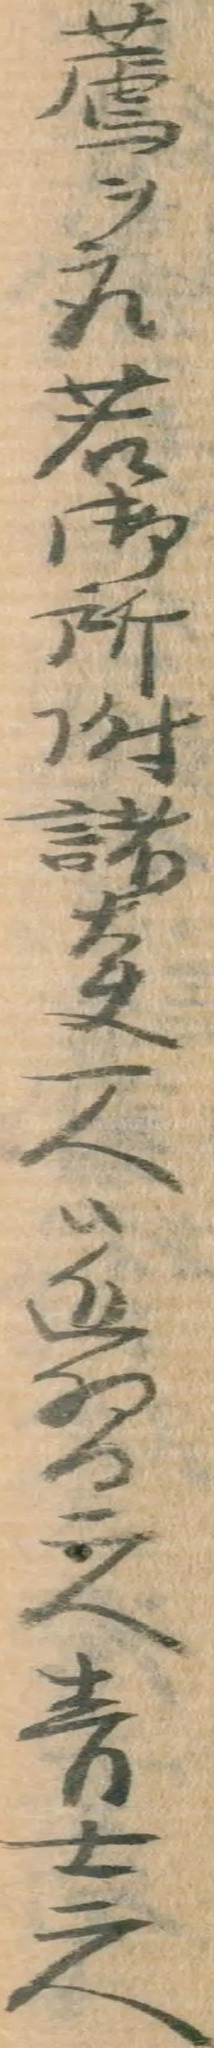薦ヲ取、若御所附諸大夫一人・御近習二人・青士二人
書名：賀茂社記録. 第63冊
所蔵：国立国会図書館 National Diet Library, JAPAN
